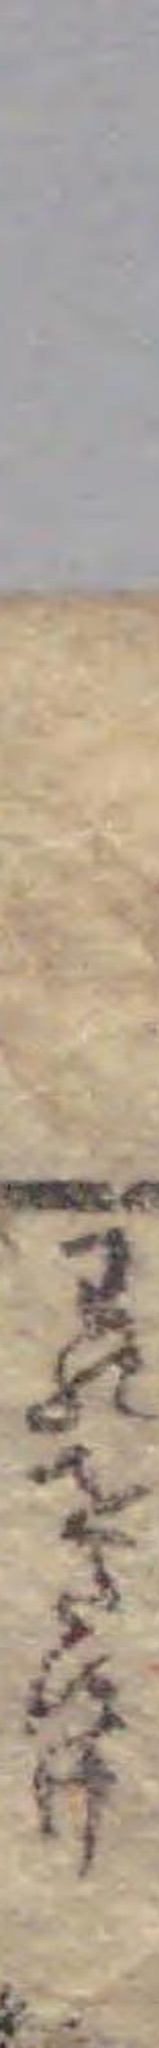われをたすけ
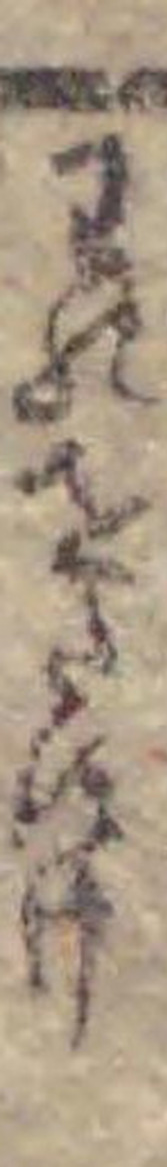われをたすけ
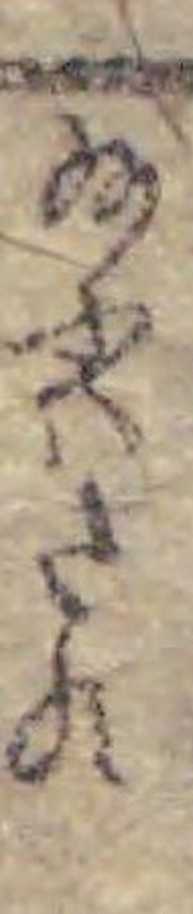給ふはたれ
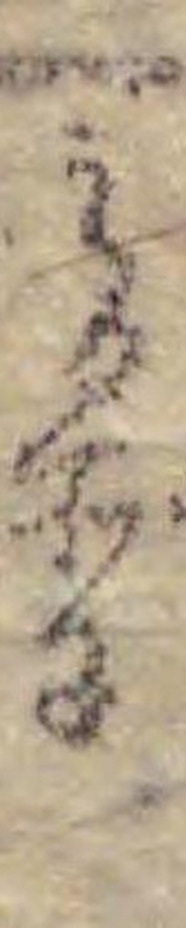みる所に
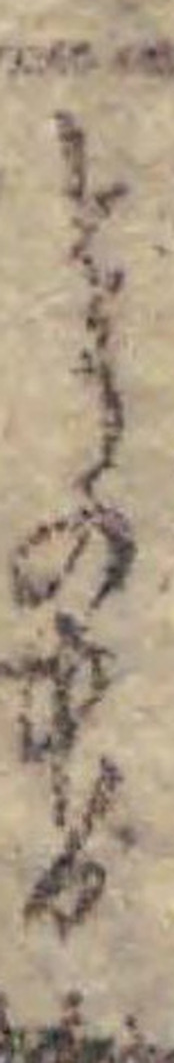どうの中ゟ
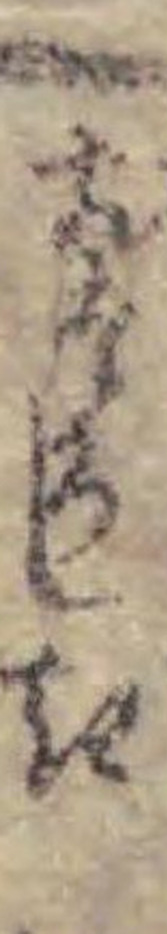おそろしき
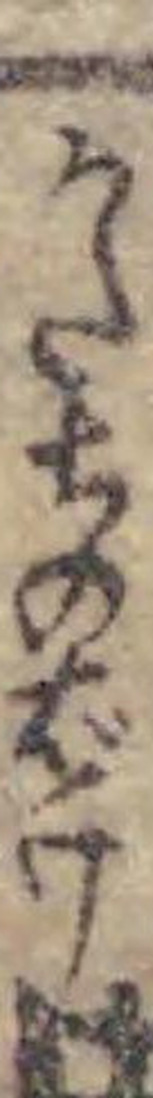かたちのばけ
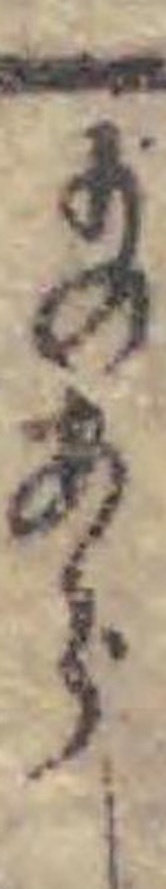ものあら
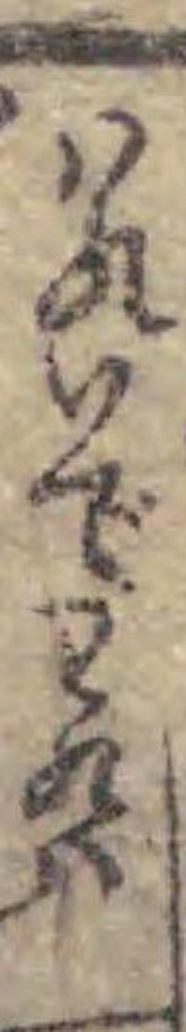はれいでわれは
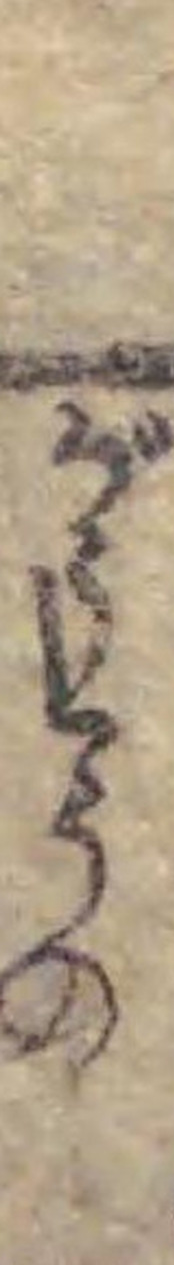がうしうの
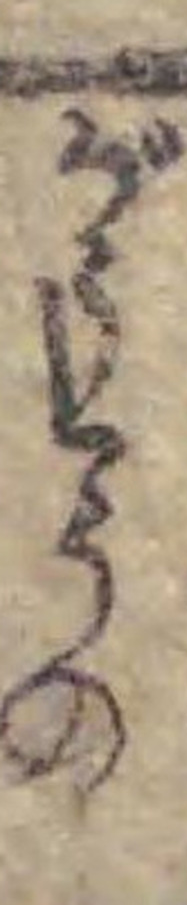がうしうの
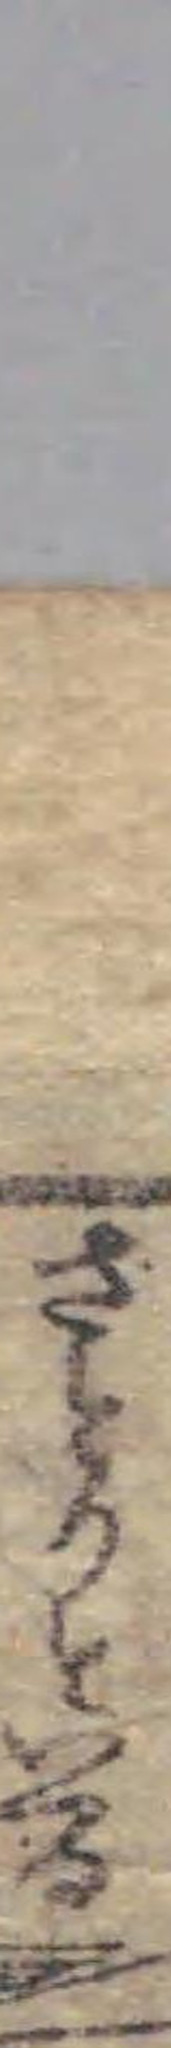さとりといへる
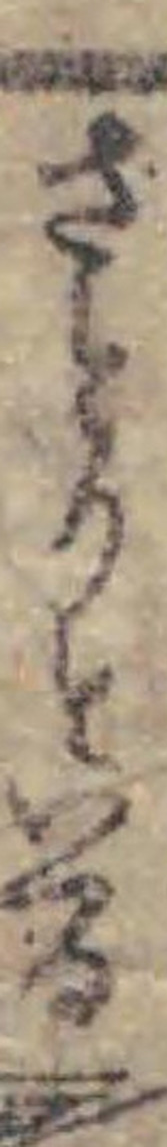さとりといへる
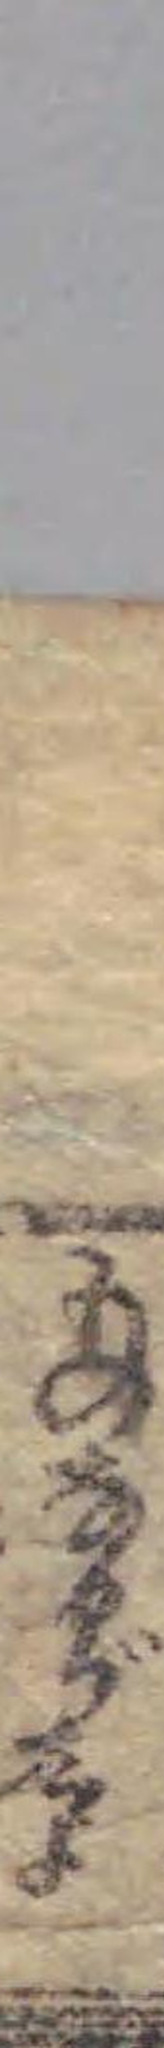ものなるがしよ
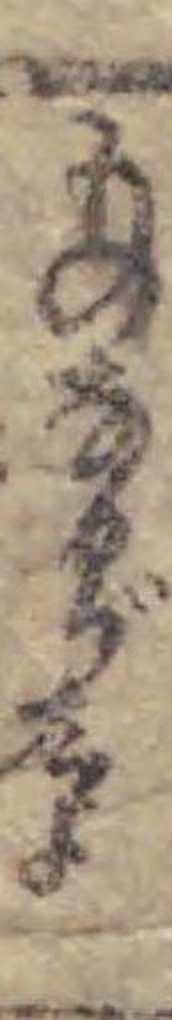ものなるがしよ
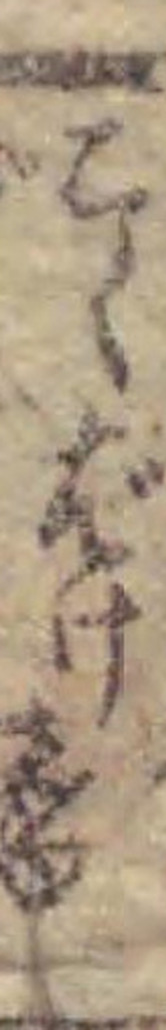こくばけしゆ
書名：化物世界夜半嵐 : 3巻
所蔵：国立国会図書館 National Diet Library, JAPAN
